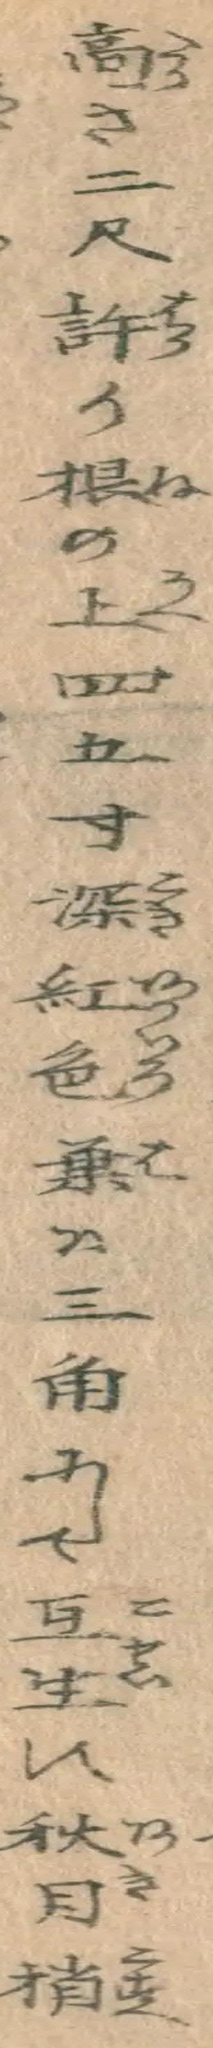高さ二尺許り根の上四五寸深紅色葉は三角にして互生す秋月梢
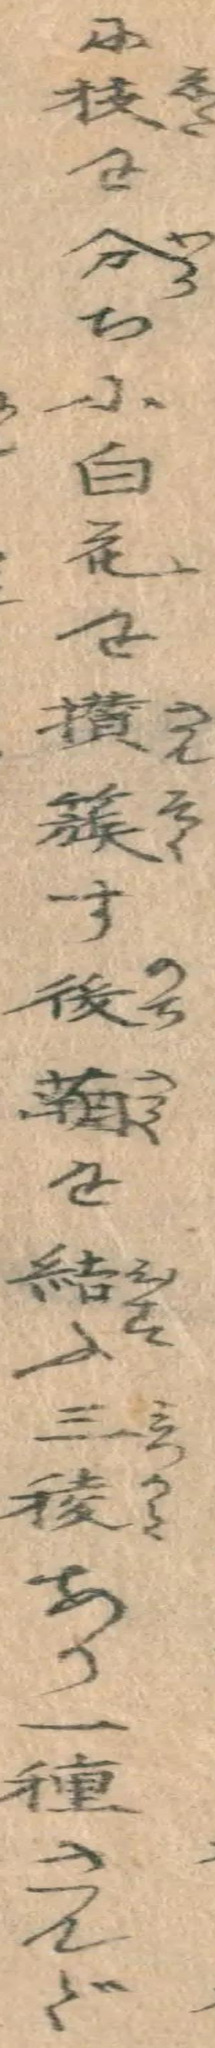に枝を分ち小白花を攢簇す後蒴を結ふ三稜あり一種さんど
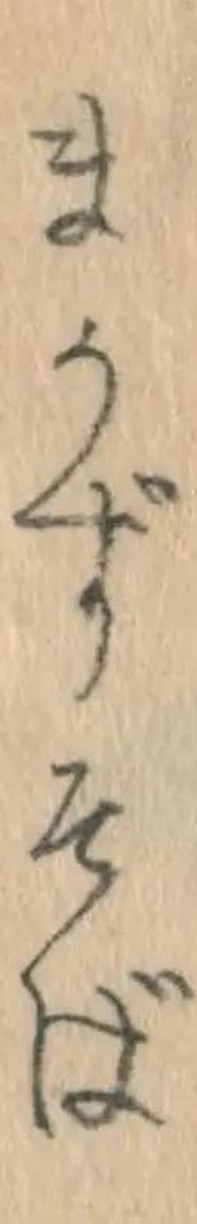まかずそば

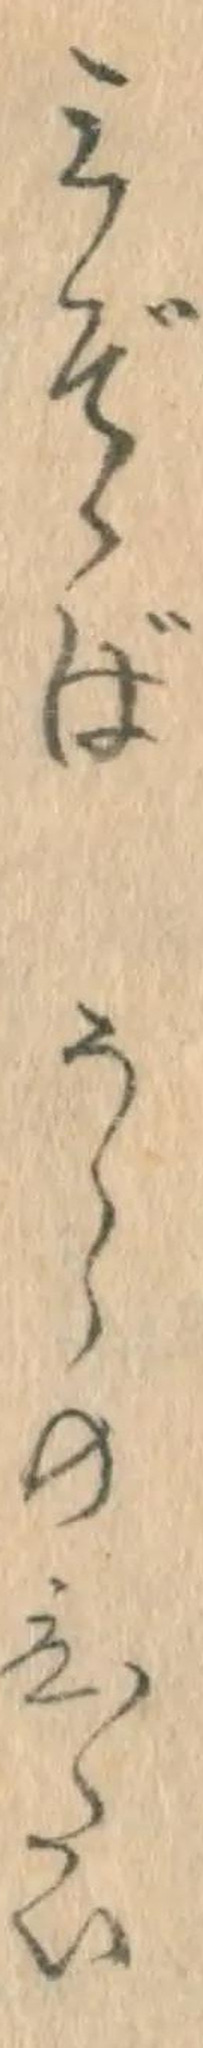みぞゝばうしのひたい
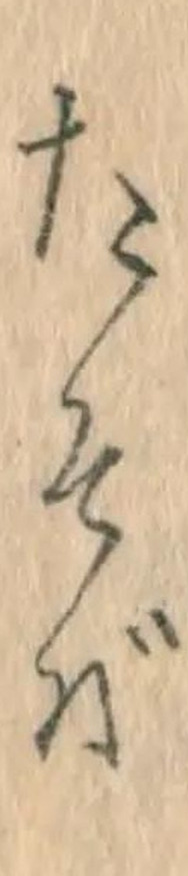おそば
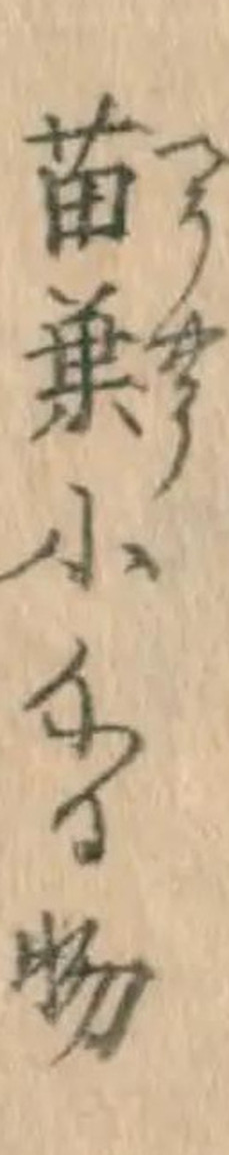苗葉小なる物
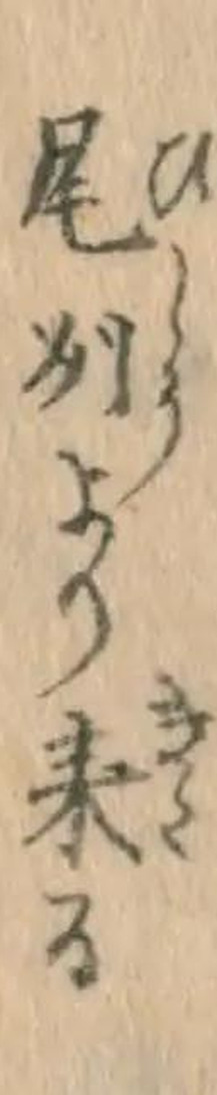尾州より来る
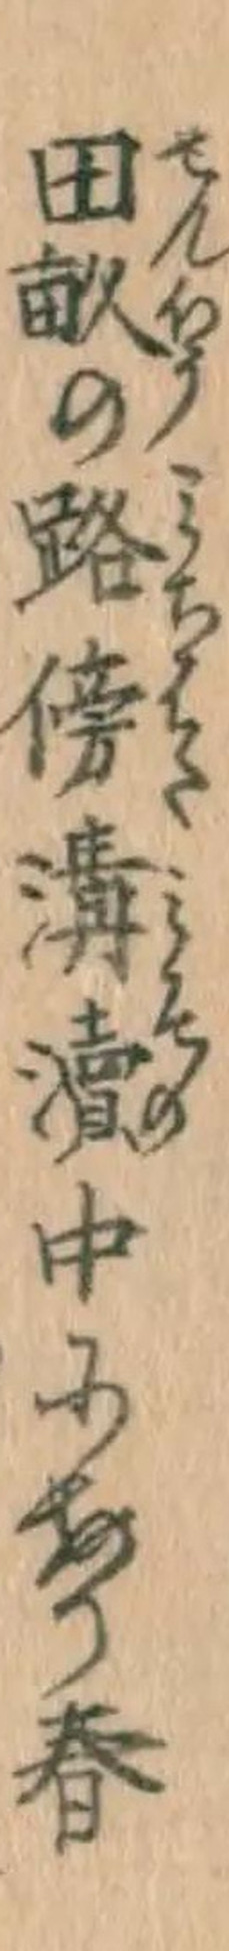田畝の路傍溝瀆中にあり春
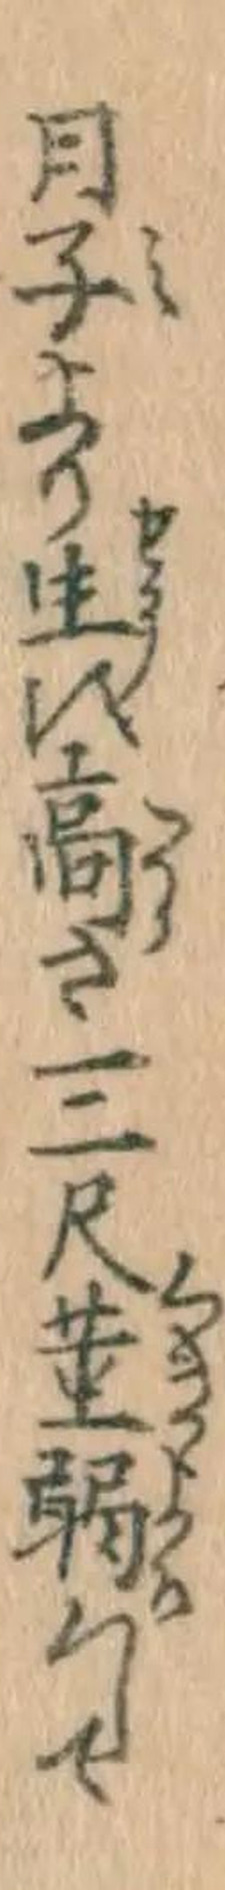月子より生す高さ一二尺茎弱くして
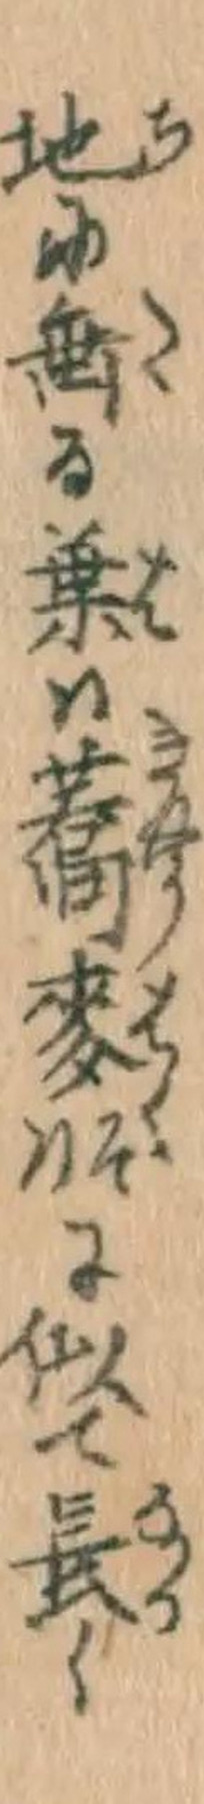地に垂る葉は蕎麦そはに似て長く
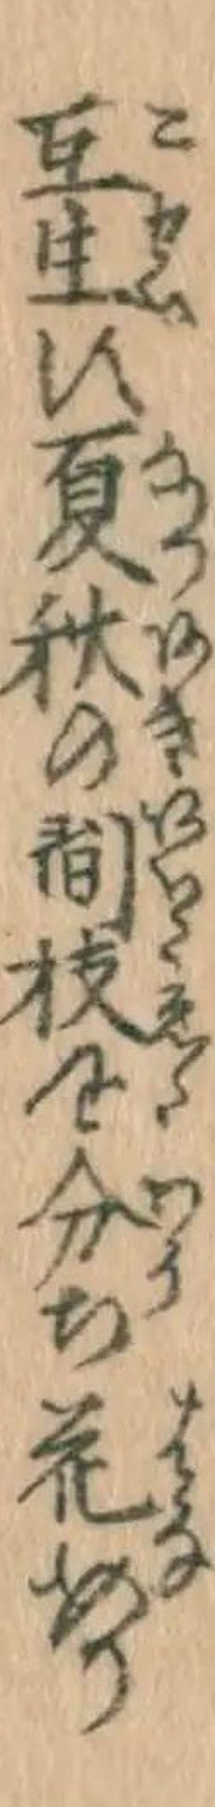互生す夏秋の間枝を分ち花あり
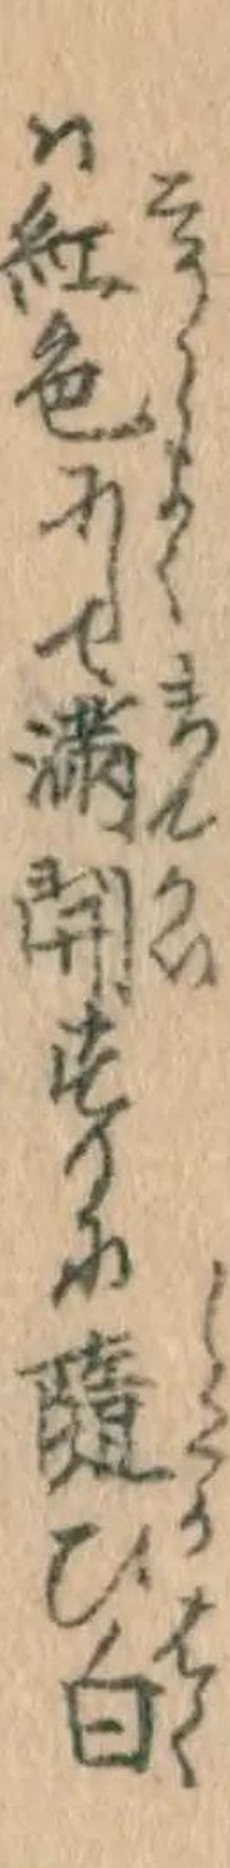は紅色にして満開するに随ひ白
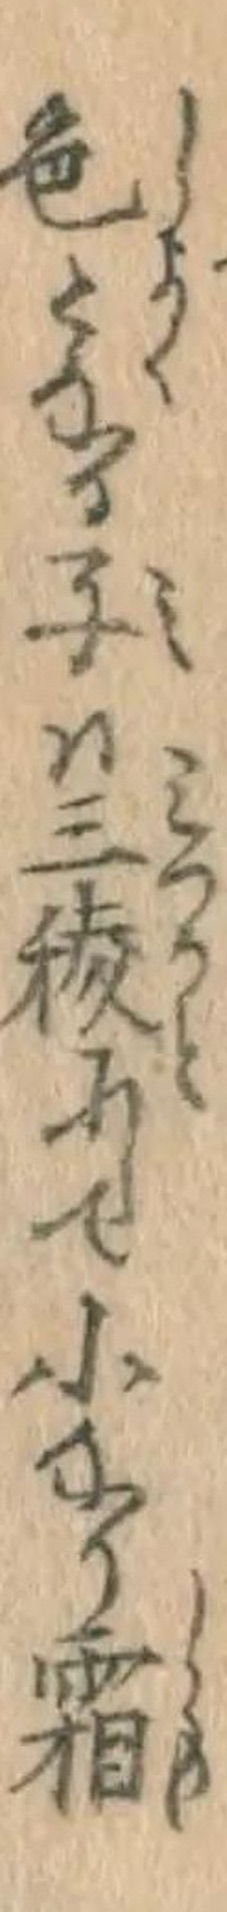色となる子は三稜にして小なり霜
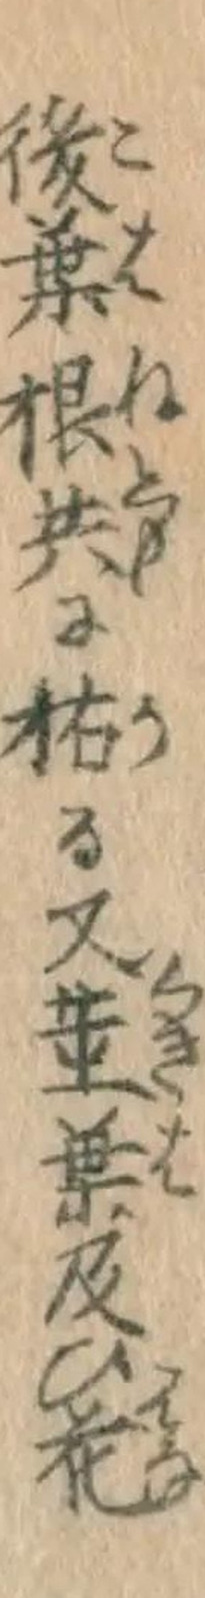後葉根共に枯る又茎葉及ひ花
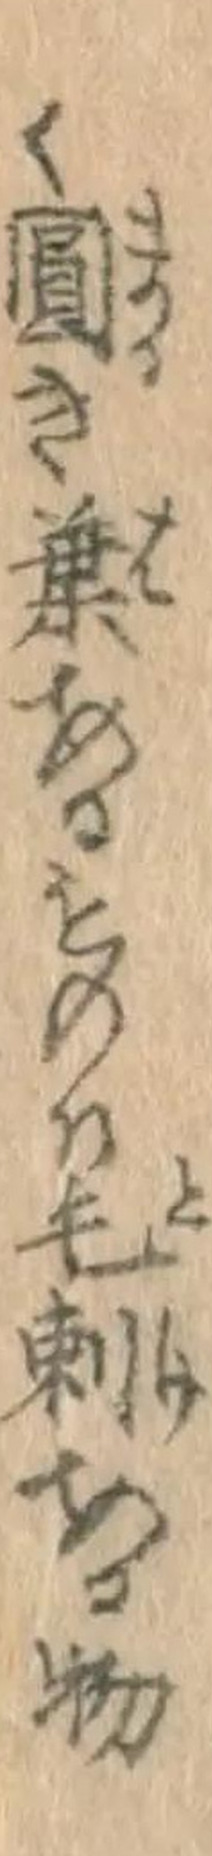く円き葉あるものは毛剌ある物
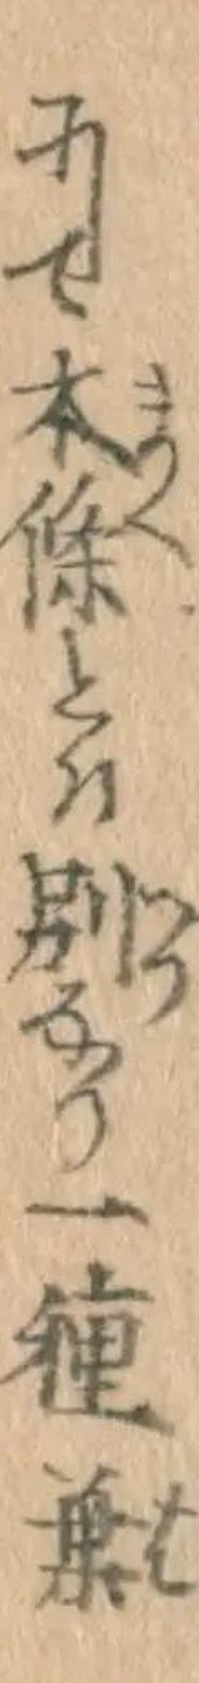にして本条とは別なり一種葉
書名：本草図譜. 巻40-42
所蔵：国立国会図書館 National Diet Library, JAPAN
